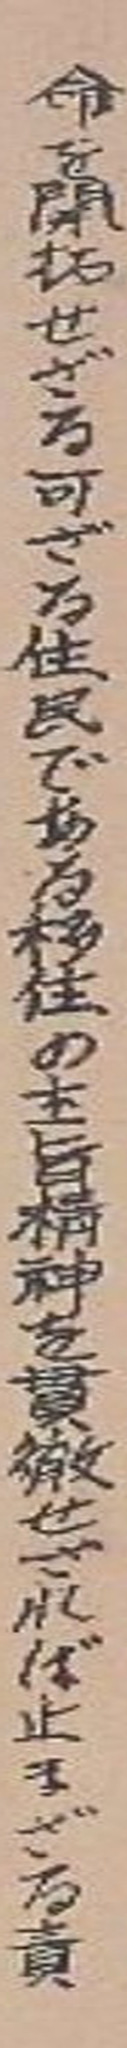命を開拓せざる可ざる住民である移住の主旨精神を貫徹せざれば止まざる責
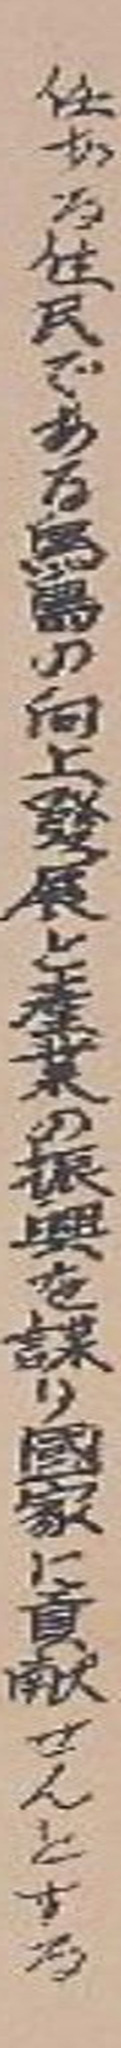任ある住民である鳥島の向上発展と産業の振興を謀り国家に貢献せんとする
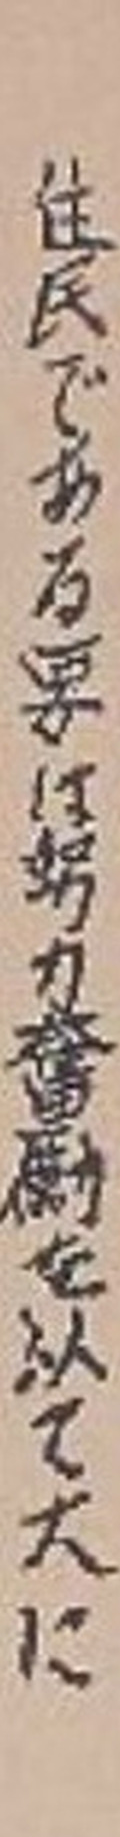住民である要は努力奮励を以て大に
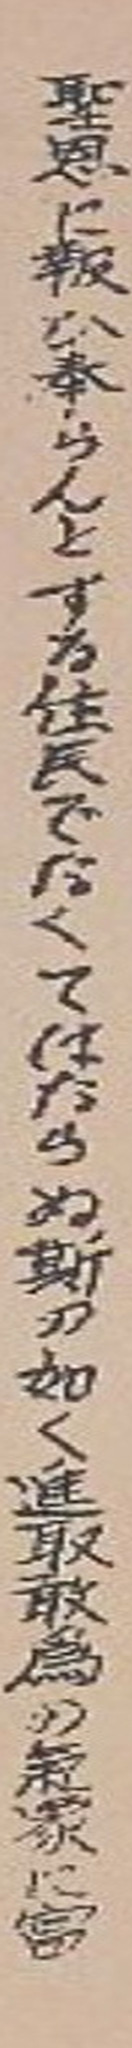聖恩に報ひ奉らんとする住民でなくてはならぬ斯の如く進取敢為の気象に富
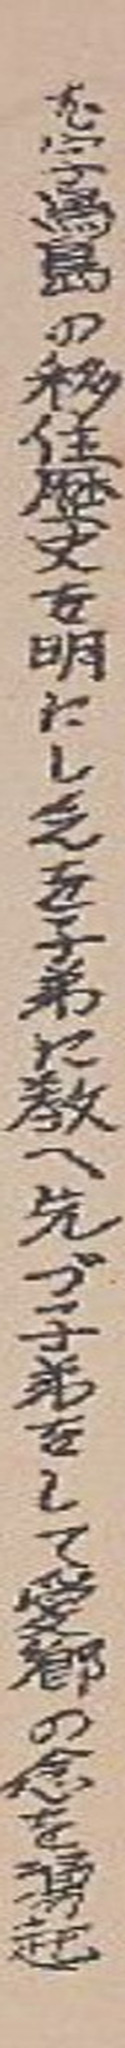む字鳥島の移住歴史を明にし之を子弟に教へ先づ子弟をして愛郷の念を湧起
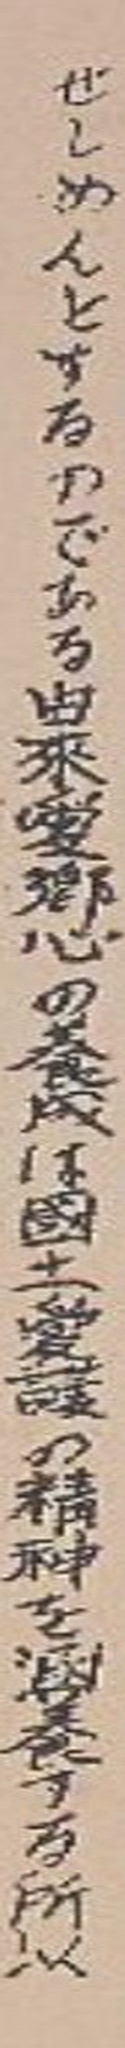せしめんとするのである由来愛郷心の養成は国土愛護の精神を涵養する所以
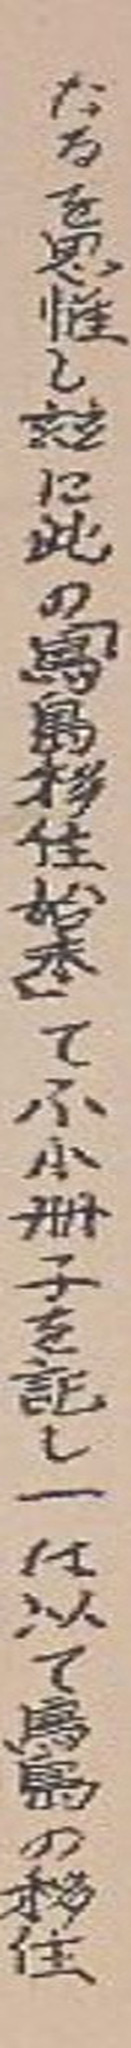たるを思惟し茲に此の「鳥島移住始末」てふ小冊子を記し一は以て鳥島の移住
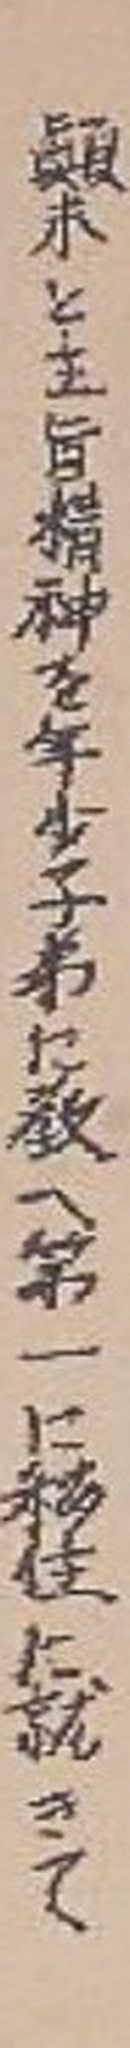顛末と主旨精神を年少子弟に教へ第一に移住に就きて
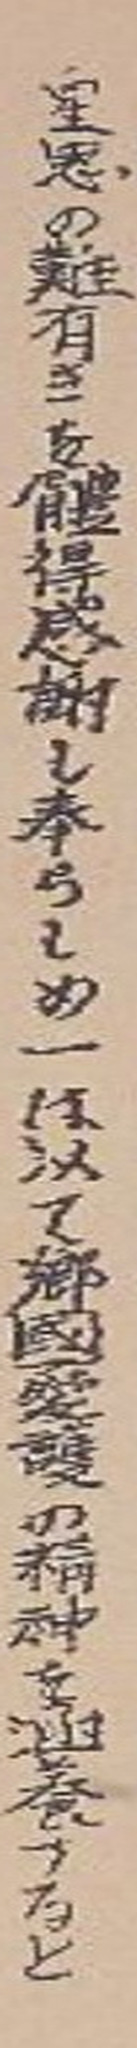皇恩の難有きを体得感謝し奉らしめ一は以て郷国愛護の精神を涵養すると
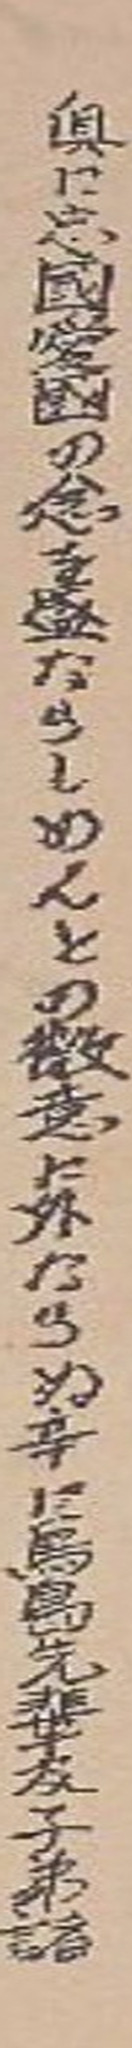倶に忠国愛国の念を盛ならしめんとの微意に外ならぬ辛に鳥島先輩及子弟諸
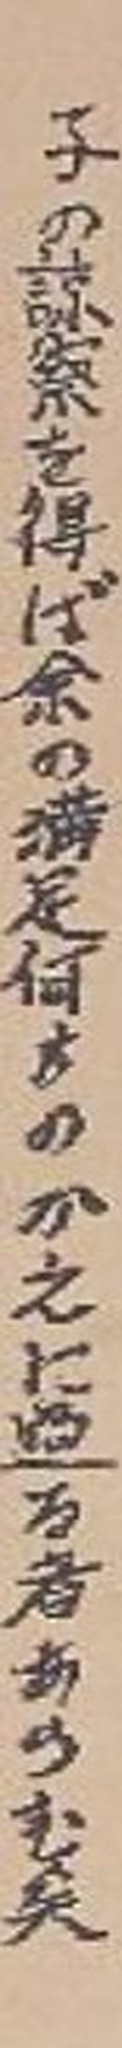子の諒察を得ば余の満足何方のか之に過る者あらむ矣
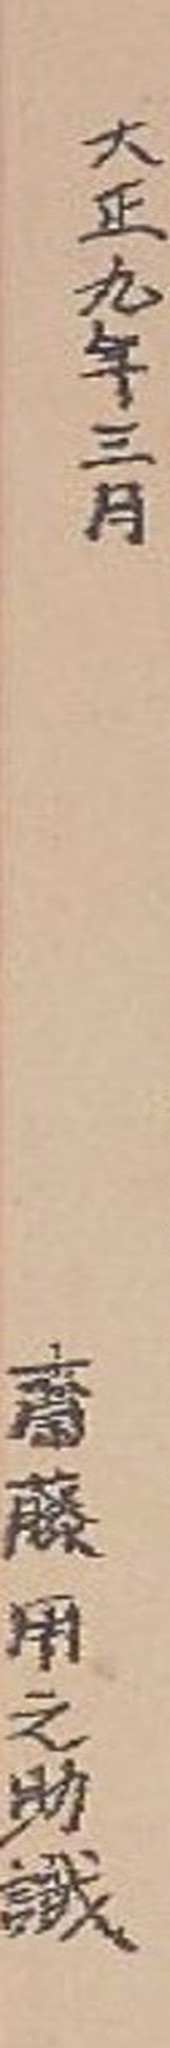大正九年三月斎藤用之助識
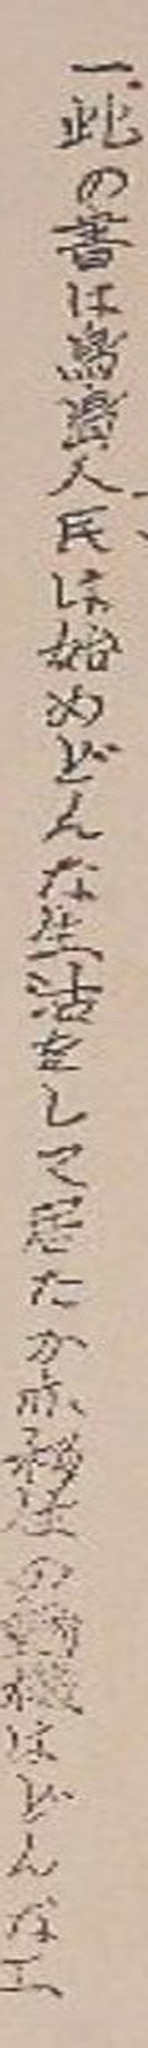一．此の書は鳥島人民は始めどんな生活をして居たか亦移住の動機はどんな工
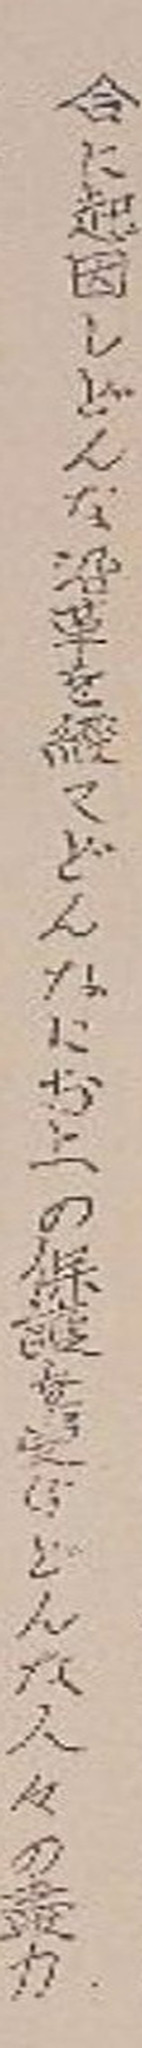合に起因しどんな沿革を経てどんなにお上の保護を受けどんな人々の尽力
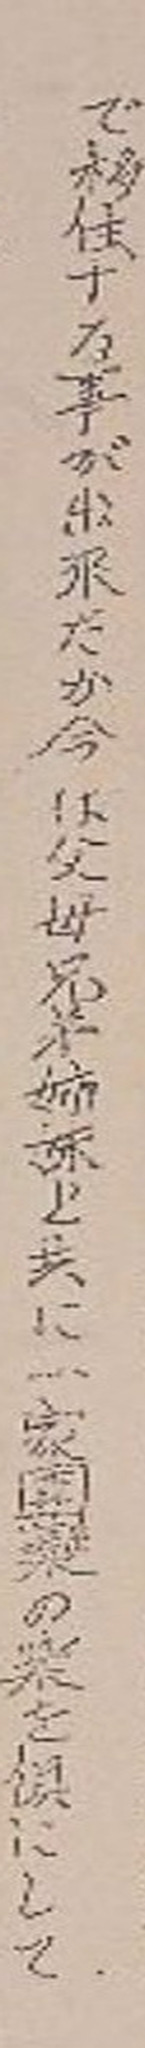で移住する事が出来たか今は父母兄弟姉妹と共に一家団欒の楽を倶にして
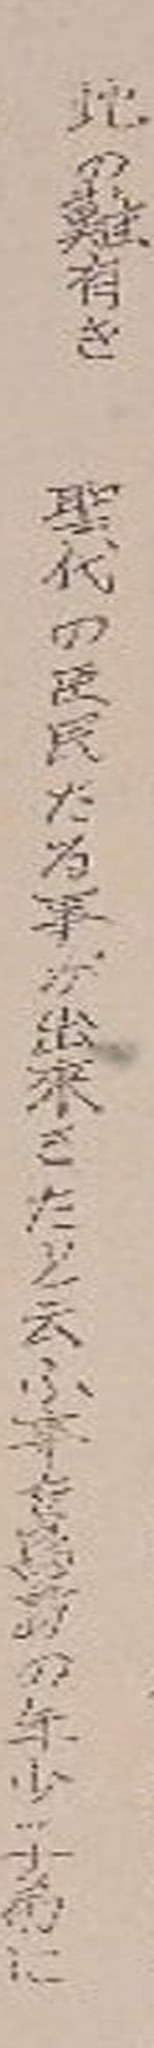此の難有き聖代の臣民たる事が出来きたと云ふ事を鳥島の年少子弟に
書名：鳥島移住始末
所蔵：University of the Ryukyus Library
